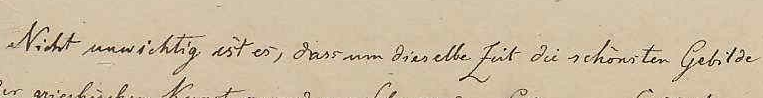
Nicht unwichtig ist es, dass um dieselbe Zeit die schönsten Gebilde
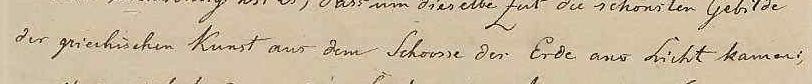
der griechischen Kunst aus dem Schoosse der Erde ans Licht kamen:
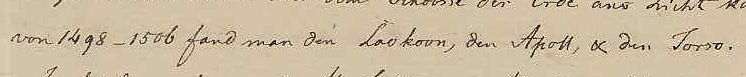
von 1498–1506 fand man den Laokoon, den Apoll, & den Torso.
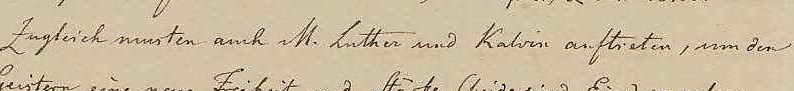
Zugleich musten auch M. Luther und Kalvin auftreten, um den
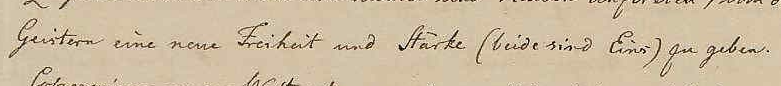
Geistern eine neue Freiheit und Stärke zu geben.
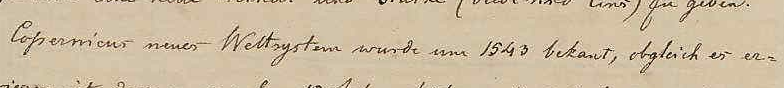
Copernicus neues Weltsystem wurde um 1543 bekant, obgleich es er-
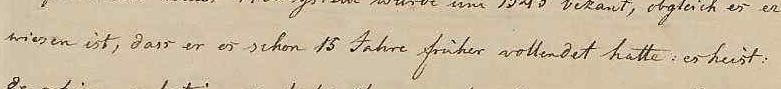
wiesen ist, dass er es schon 15 Jahre früher vollendet hatte: es heist:
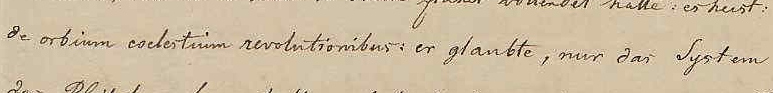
de orbium coelestium revolutionibus: er glaubte, nur das System
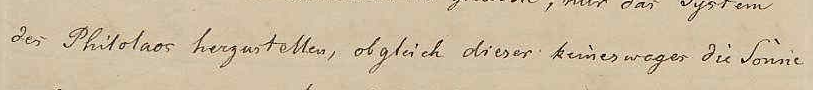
des Philolaos herzustellen, obgleich dieser keinesweges die Sonne
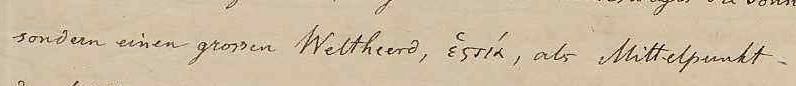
sondern einen grossen Weltheerd, , als Mittelpunkt
